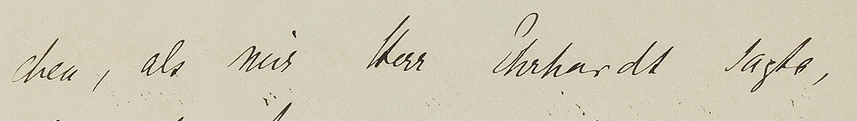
chen, als mir Herr Ehrhardt sagte,
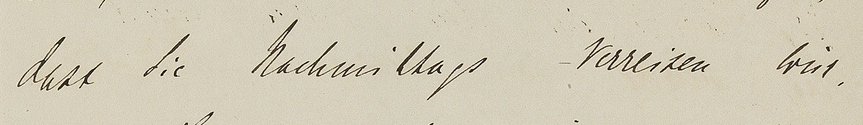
dass Sie Nachmittags verreisen wer-
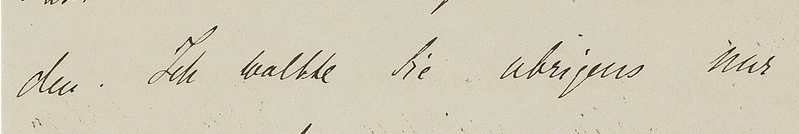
den. Ich wollte Sie übrigens nur
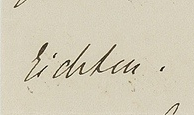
richten.
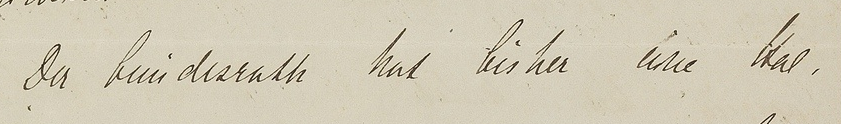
Der Bundesrath hat bisher eine Hal-
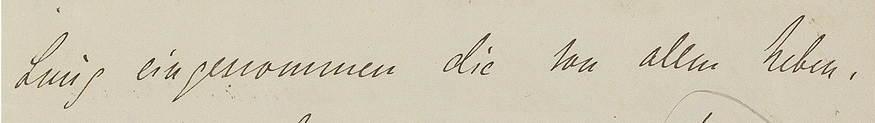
tung eingenommmen die von allen Neben-
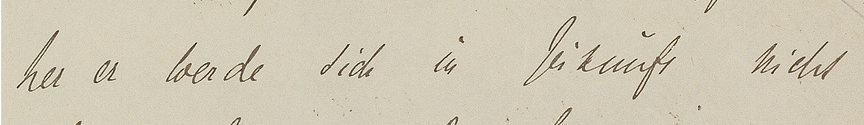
her er werde sich in Zukunft nicht
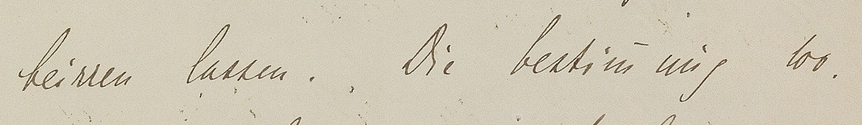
beirren lassen. Die Bestimmung wo-
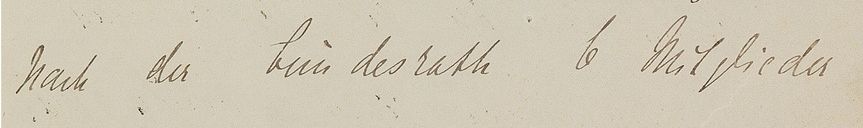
nach der Bundesrath 6 Mitglieder
